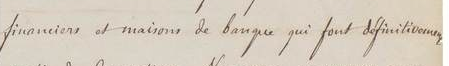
financiers et maisons de banque qui font définitivement
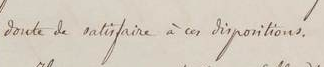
doute de satisfaire à ces dispositions.
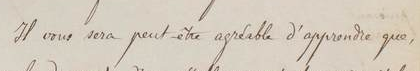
Il vous sera peut être agréable d'apprendre que,
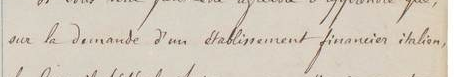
sur la demande d'un établissement financier italien,
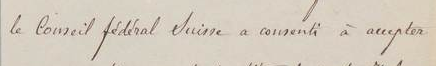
le Conseil fédéral Suisse a consenti à accepter
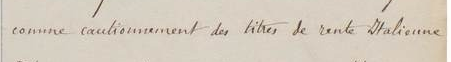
comme cautionnement des titres de rente Italienne
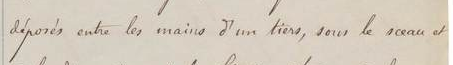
déposés entre les mains d'un tiers, sous le sceau et
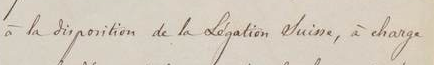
à la disposition de la Légation Suisse, à charge
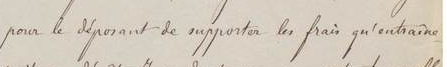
pour le déposant de supporter les frais qu'entraîne-
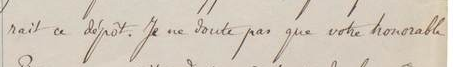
rait ce dépôt. Je ne doute pas que votre honorable
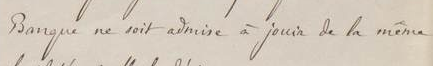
Banque ne soit admise à jouir de la même
